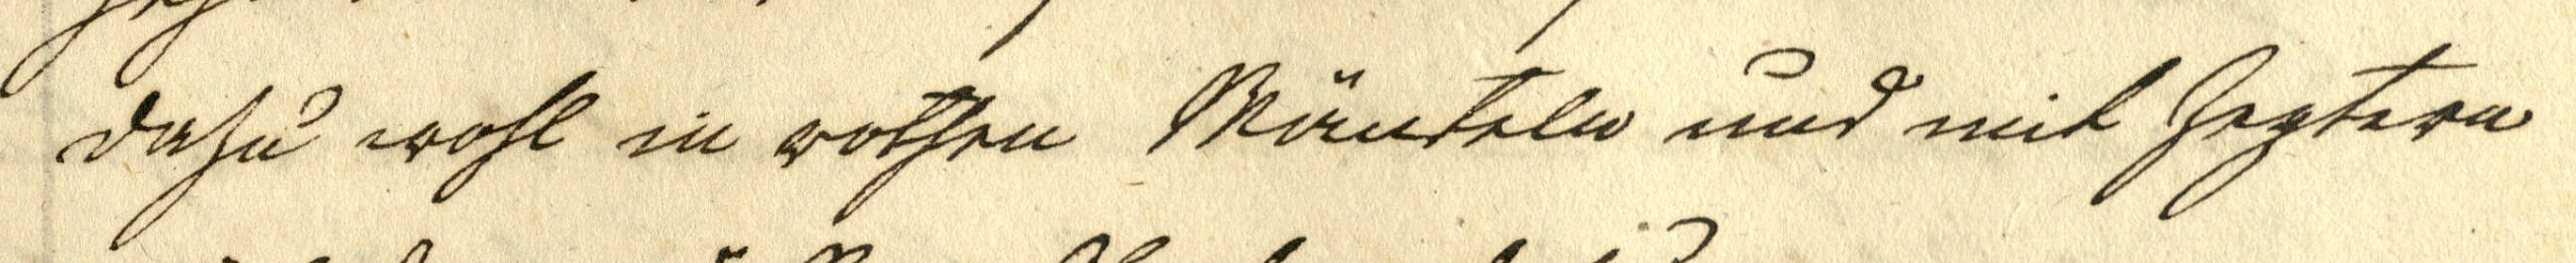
dazu wohl in rothen Mänteln und mit Zeptern
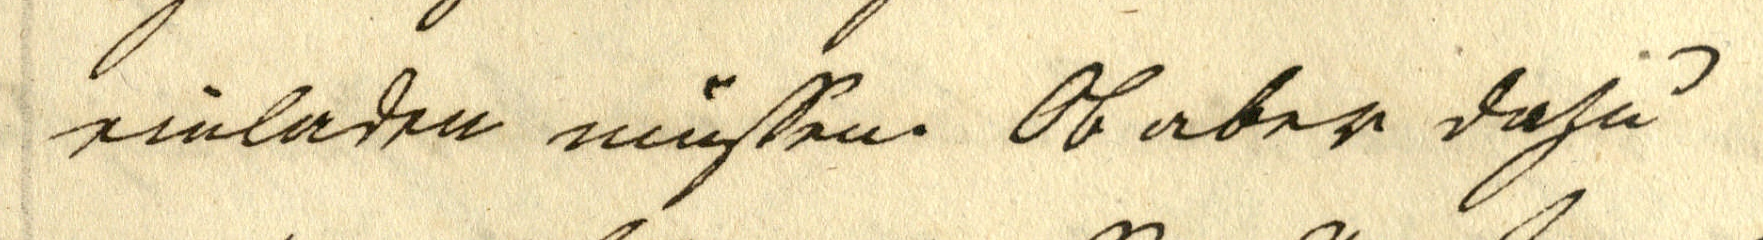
einladen müssen. Ob aber dazu
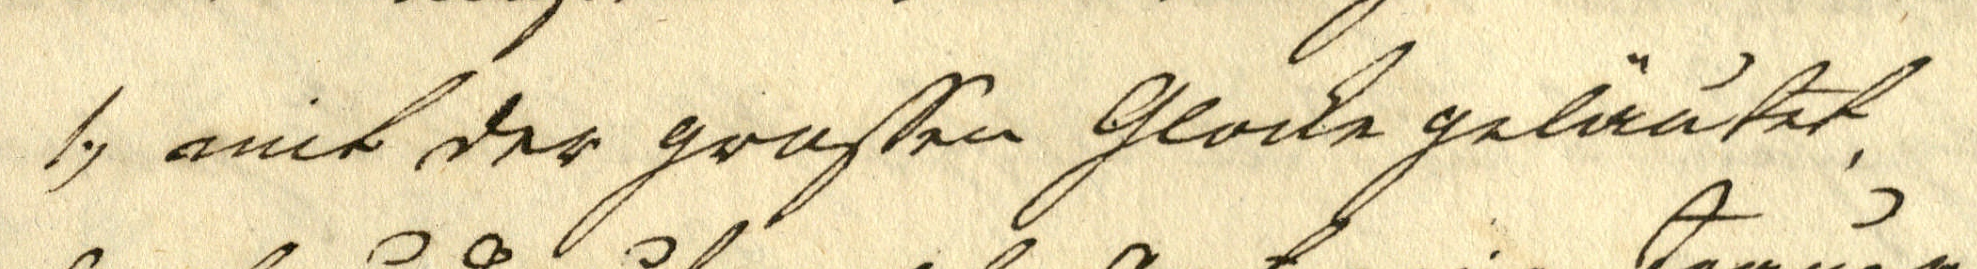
1., mit der grossen Glocke geläutet
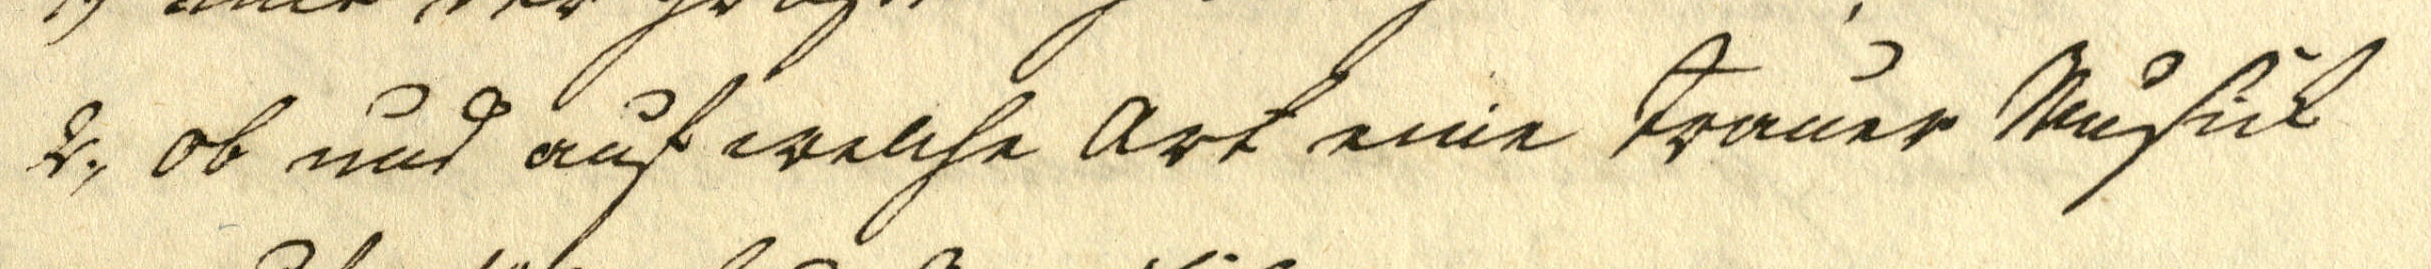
2., ob und auf welche Art eine Trauer Musick
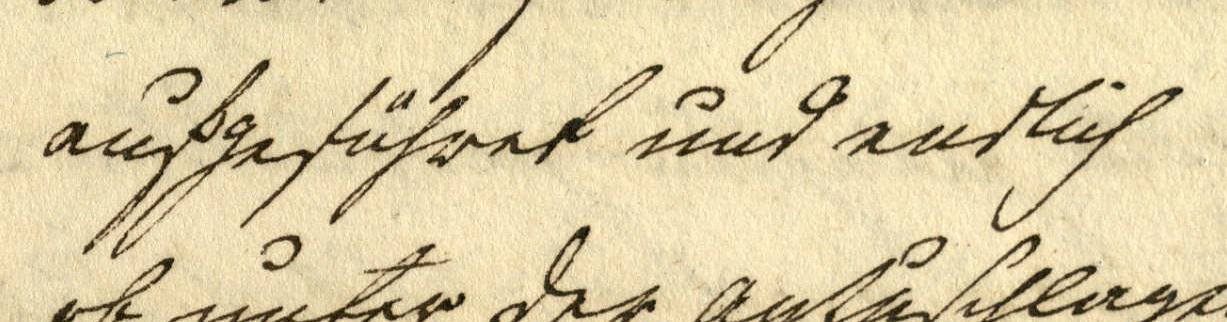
aufgeführet und endlich
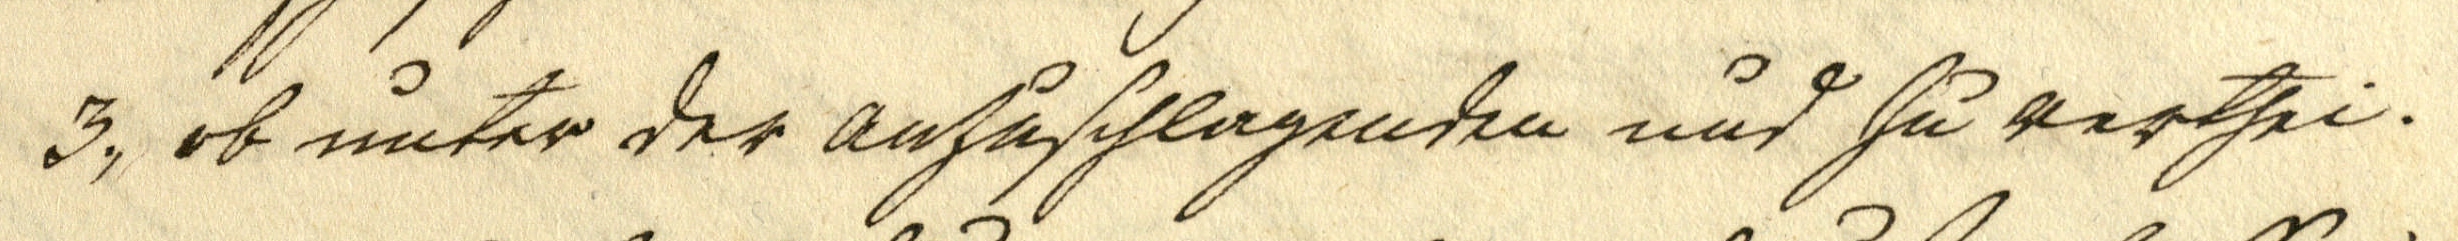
3., ob unter der anzuschlagenden und zu verthei¬
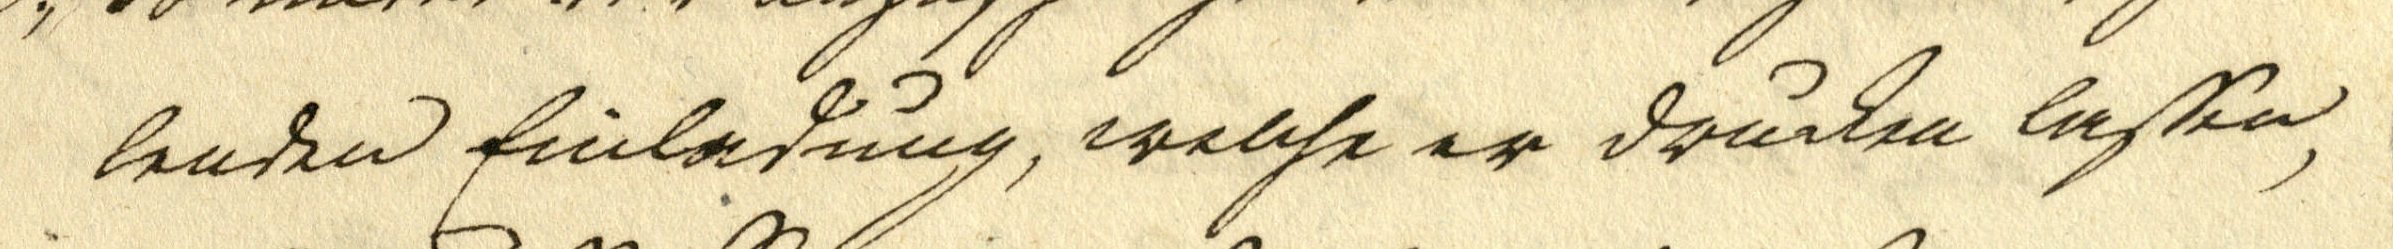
leiden Einladung, welche er drucken lassen,
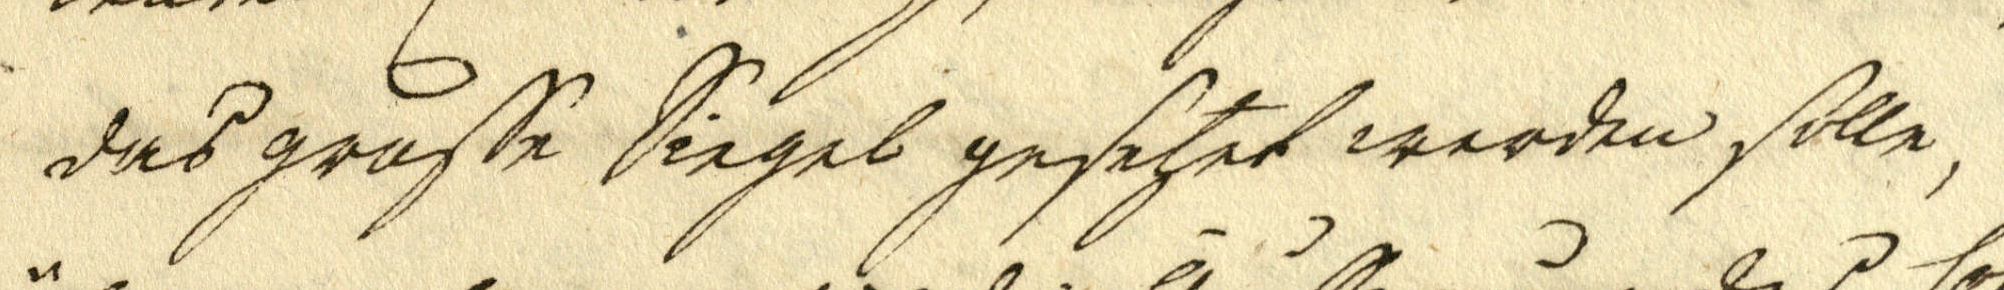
das grosse Siegel gesetzet werden solle,
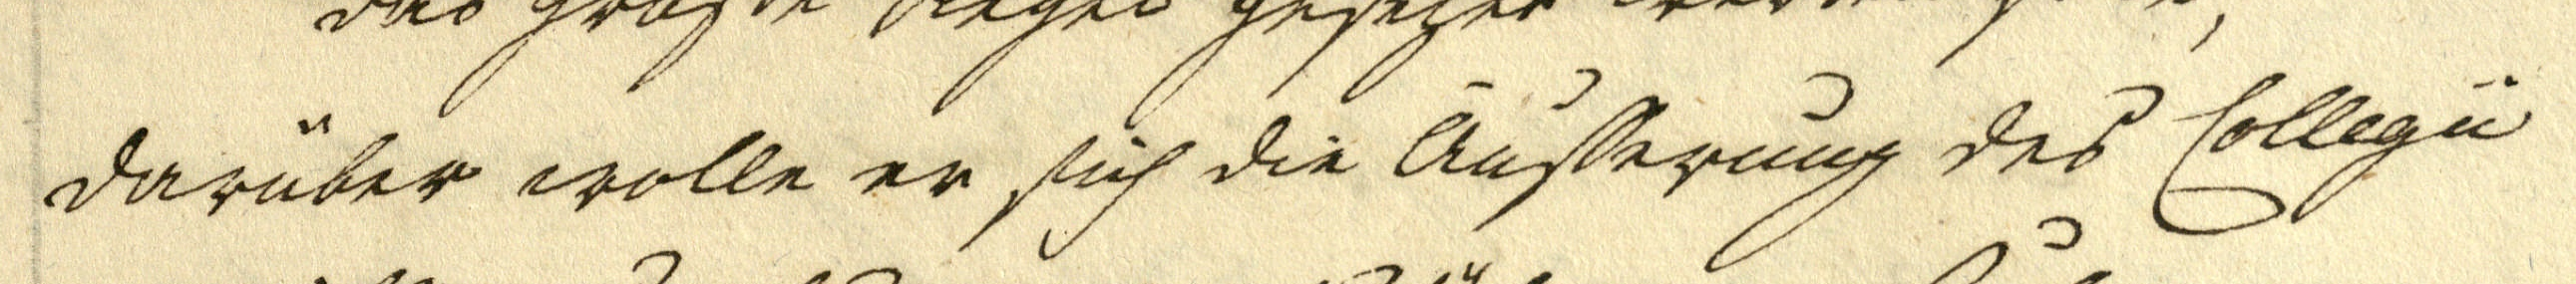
darüber wolle er sich die Äusserung des Collegii
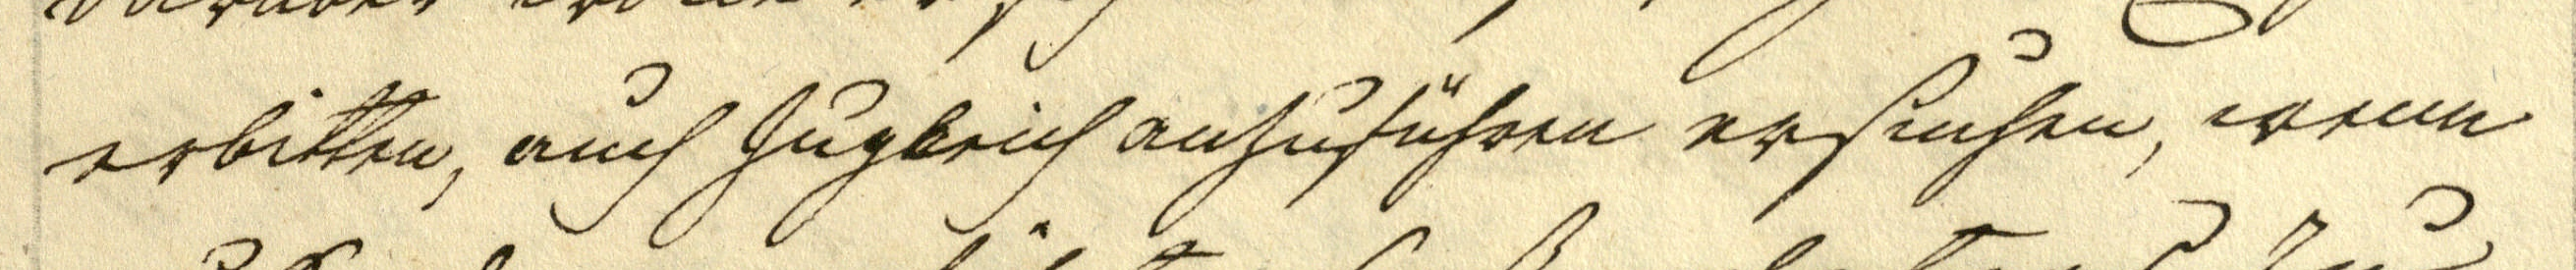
erbitten, auch zugleich anzuführen ersuchen, wenn
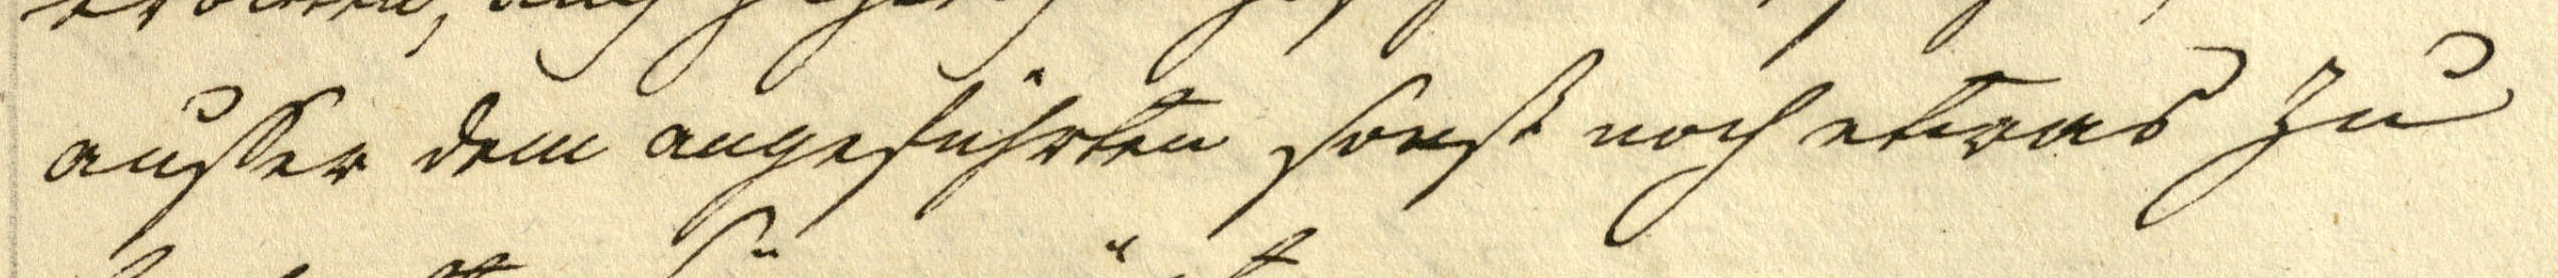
ausser dem angeführten sonst noch etwas zu
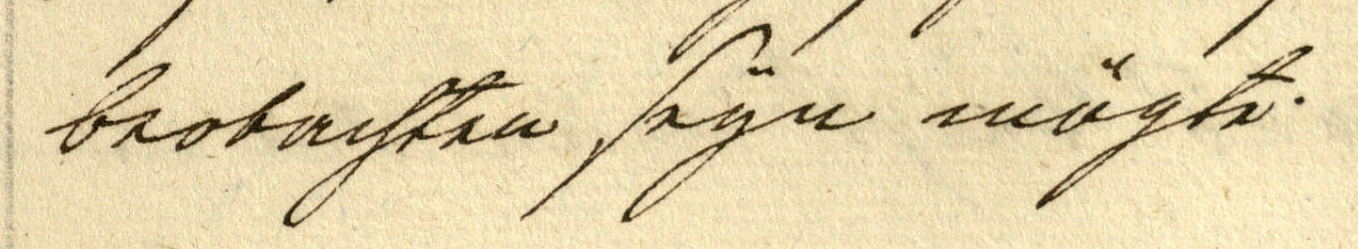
beobachten seÿn mögte.
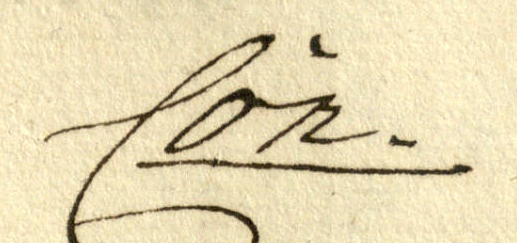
Con.
